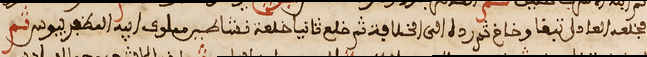فخلعه العادل تبقاوخاخ ثم رده الى الخلافة ثم خلع ثانيا خلعة نشاطير مملوك ابيه المظفر بيرس ثم
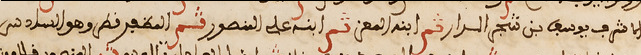الاشرف يوسف بن شجر الدار ثم ابنه المعز ثم ابنه على المنصور ثم المظفر قطر و هو السادس
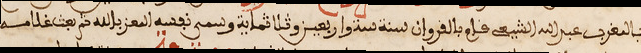بالمغرب عبد الله الشيعى قام بالقروان سنة ست و اربعين و ثلاثماية و سمى نفسه المعز باله ثم بعث غلامه
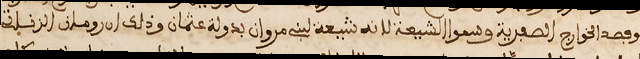و قصد الخوارج الصفرية و سموا الشيعة لانه شيعة لبنى مروان بدولة عثمان و ذلك ان رومان الزناتى
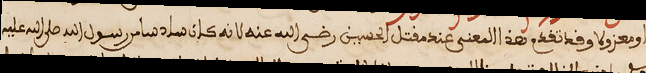او معزولا و قد تقدم هذا المعنى عند مقتل الحسين رضى الله عنه كانه كان سادسا من رسول الله صلى الله عليه
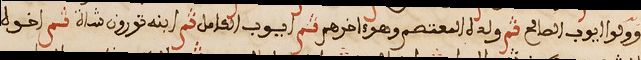و ولوا ايوب الصالح ثم ولده المعتصم و هو ءاخرهم ثم ايوب الكامل ثم ابنه تورون شاة ثم اخوه
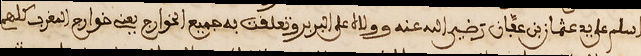اسلم على يد عثمان بن عفّان رضي الله عنه و ولاه على البربر و تعلقت به جميع الخوارج يعنى خوارج المغرب كلهم
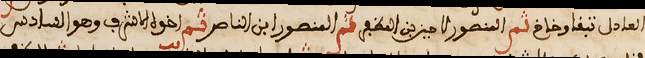العادل تبقاوخاخ ثم المنصور ### بن المظفر ثم المنصور ابن الناصر ثم اخوه الاشرف و هو السادس
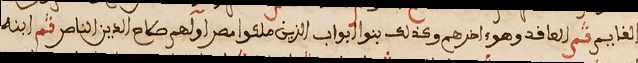القايم ثم العاقد و هو ءاخرهم و كذلك بنوا أبواب الذين ملكوا مصر اولهم صلاح الدين الناصر ثم ابنه
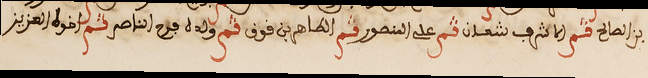بن الصالح ثم الاشرف شعان ثم على المنصور ثم الطاهر بن قوق ثم ولده فرح الناصر ثم اخوه العزيز
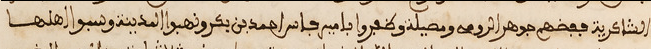الشاكرية ففضهم جوهر الرومى و مصيلة و ظفرا بامير فاس احمد بن بكر و نهبوا المدينة و سبوا اهلها
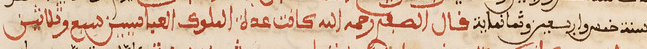سنة خمس و اربعين و ثمانماية قال الصفى رحمه الله كانت عدة الملوك العباسيين سبع و ثلاثين
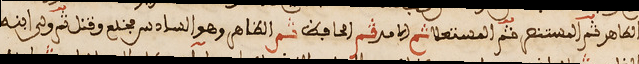الطاهر ثم المستنصر ثم المستعلا ثم الامر ثم الحافظ ثم الظاهر و هو السادس فخلع و قتل ثم ولى ابنه
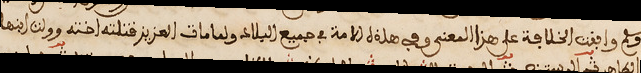و ### وافقت الخلافة على هذا المعنى و في هذه ه الامة في جميع البلاد و لما مات العزيز قتلته اخته و ولت ابنها
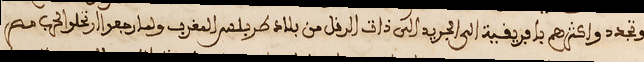و تجدد و اكثرهم بافريقية الى الجريد الى ذات ### من بلاد طربلس المغرب و لما رجعوا ارتحلوا لحرب مصر
